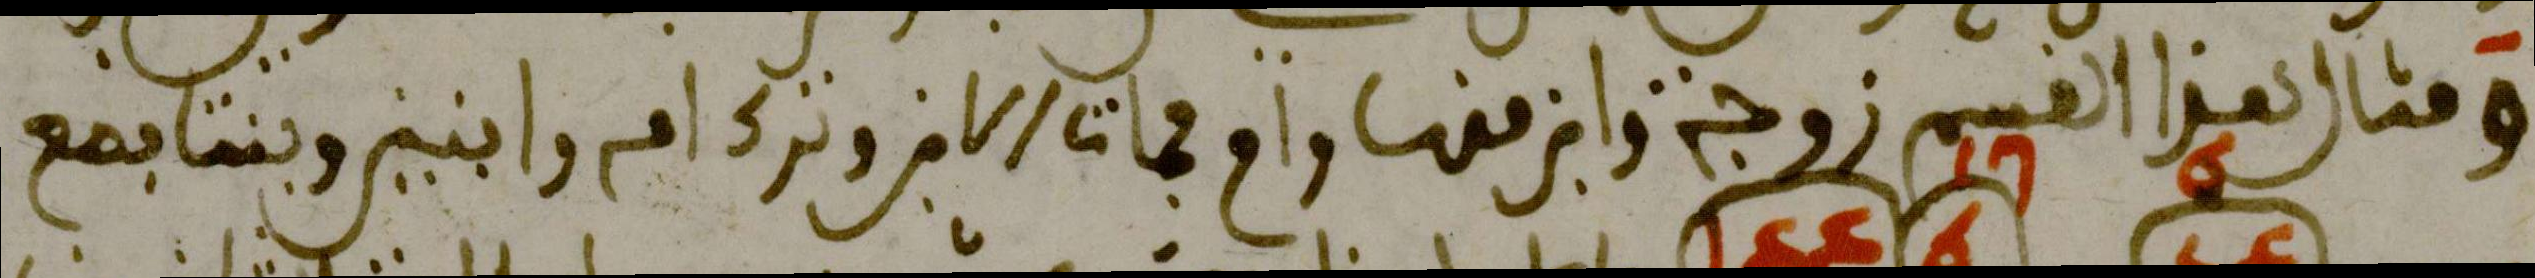وَمثال هذا القسم زوجة وابن منها وام فمات الابن وترك امه ابنين وبنتا فضع
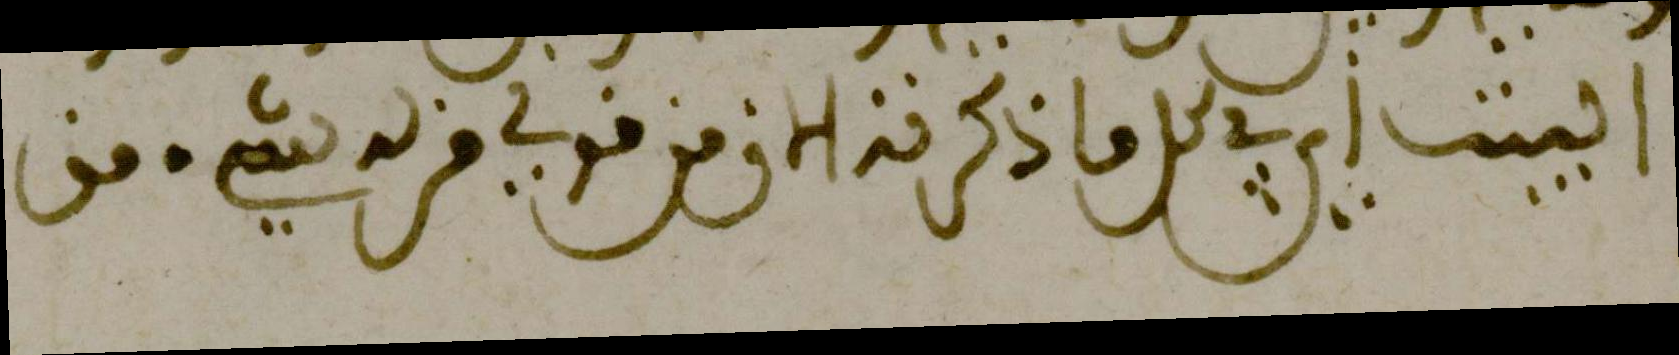البيت اي في كل ما ذكرته الان من قولي من له شيء من
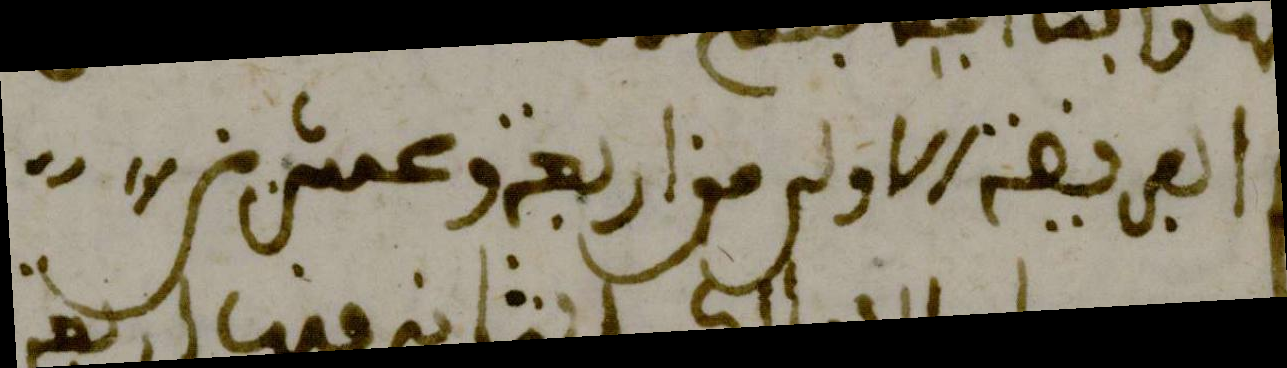الفريضة الاولى من اربعة وعشرين
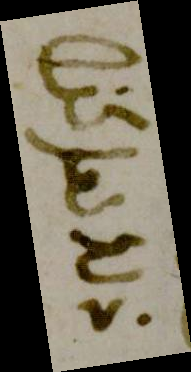ذلك هاكذا
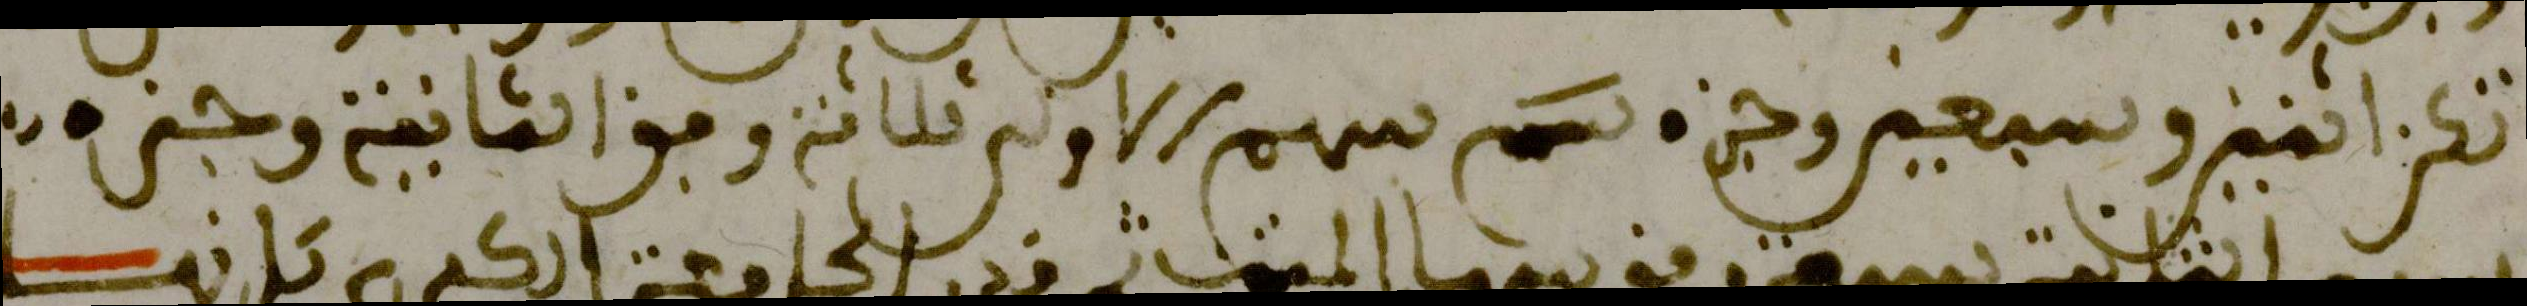تكن اثنين وسبعين وجزء سهم سهم الاولى ثلاثة وفق الثانية وجزء
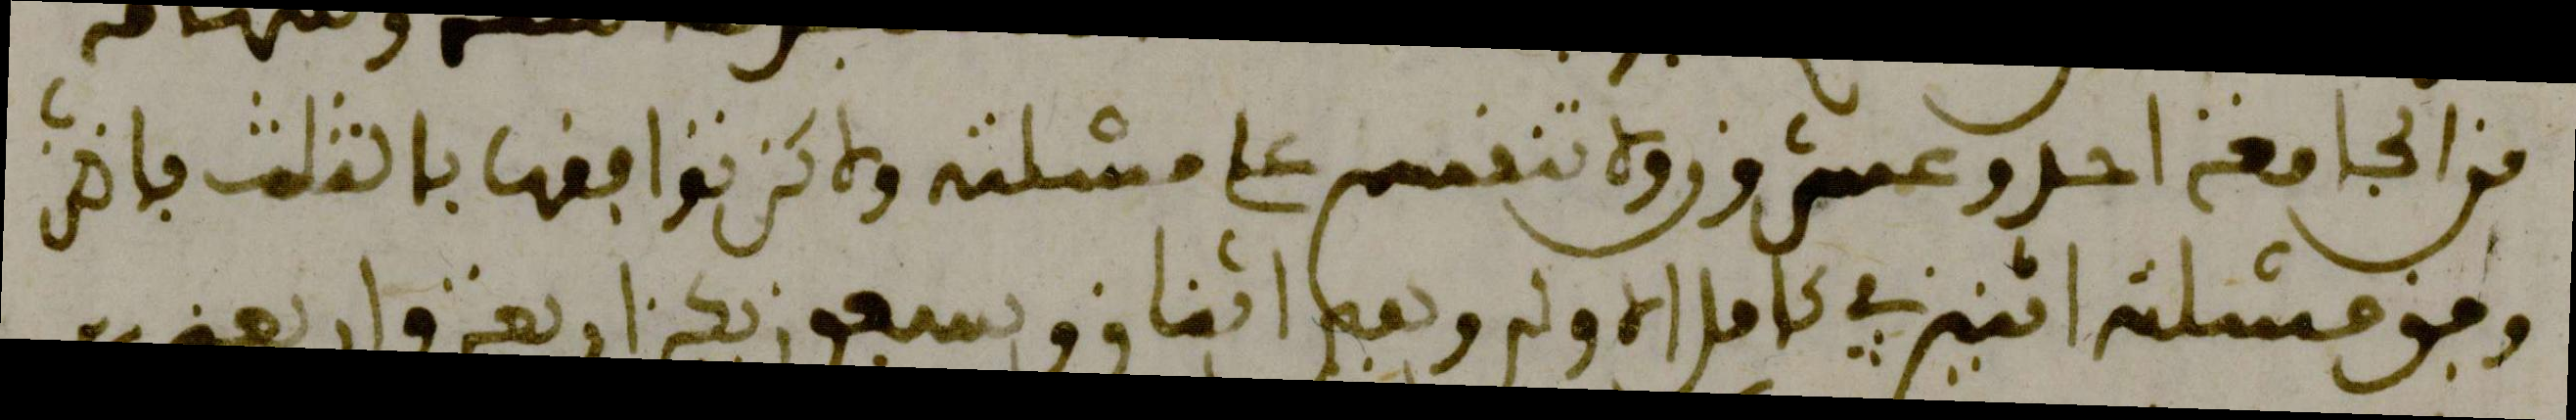من الجامعة احد وعشرون ولا تنقسم على مسْلته ولاكن توافقها بالثلث فاضرب
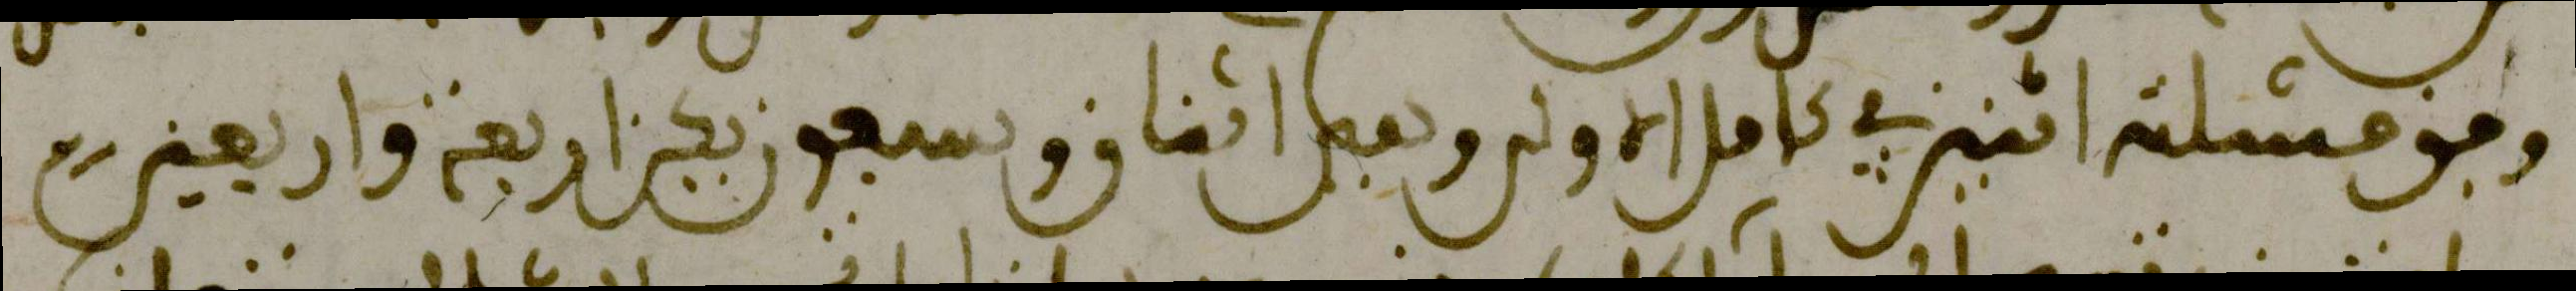وفق مسْلته اثنين في كامل الاولى وهي اثنان وسبعون يكن اربعة واربعين
